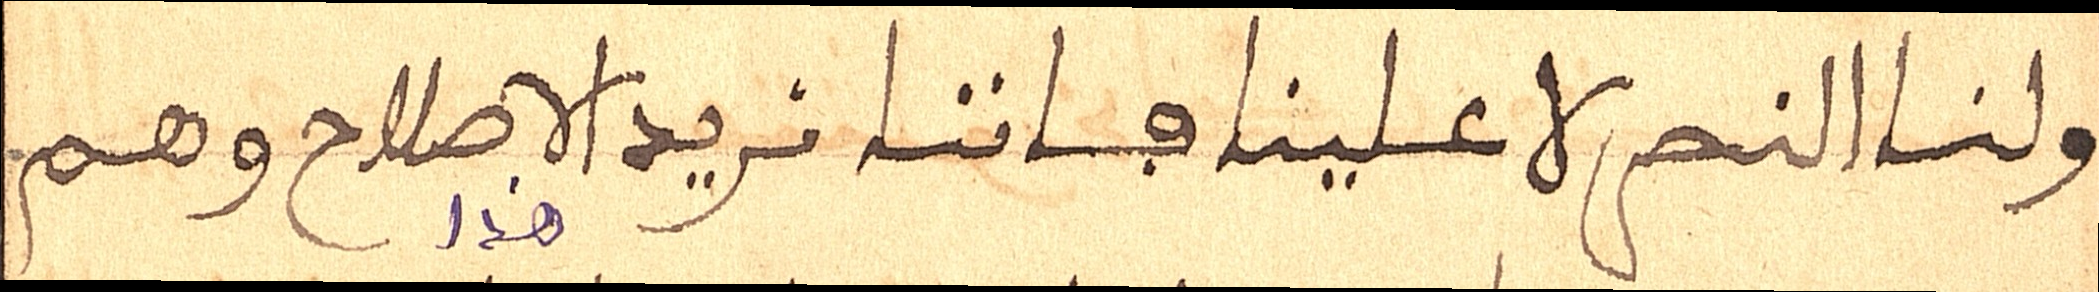ولنا النصر لا علينا فاتا نريد الاصلاح وهم
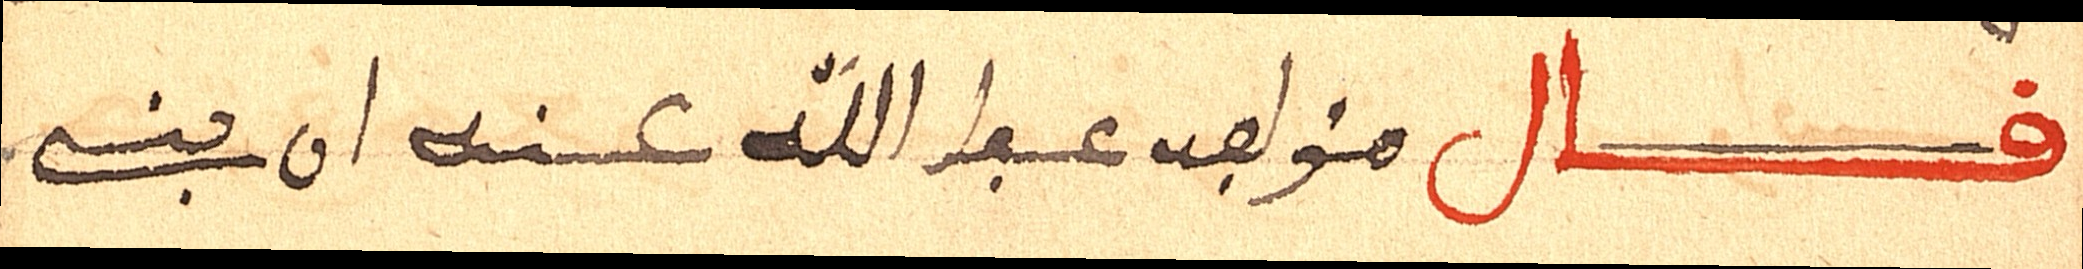قال مؤلفه عفا الله عنه ان بنى
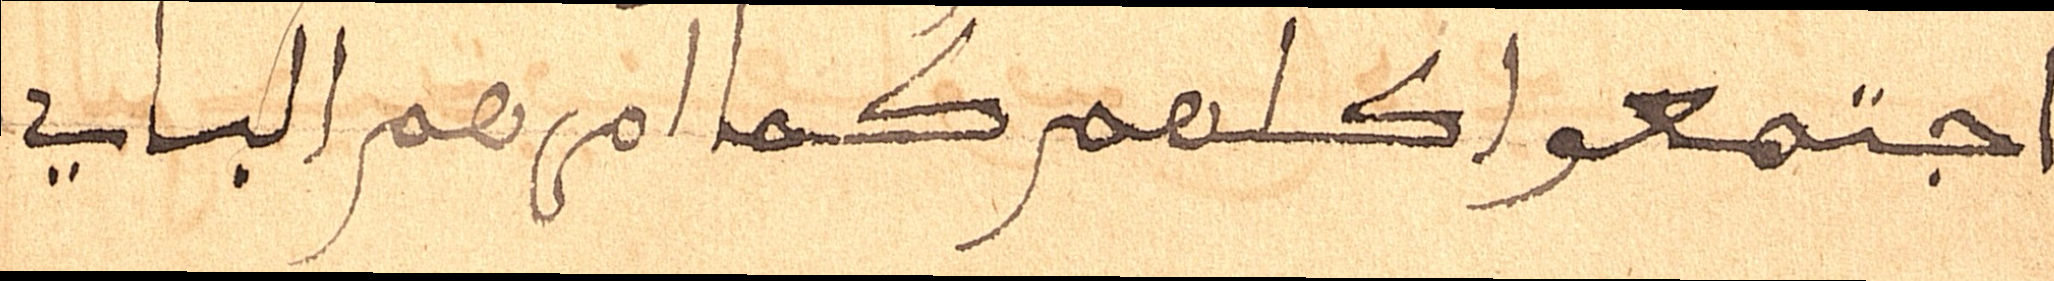اجتمعوا كلهم كما امرهم الباي
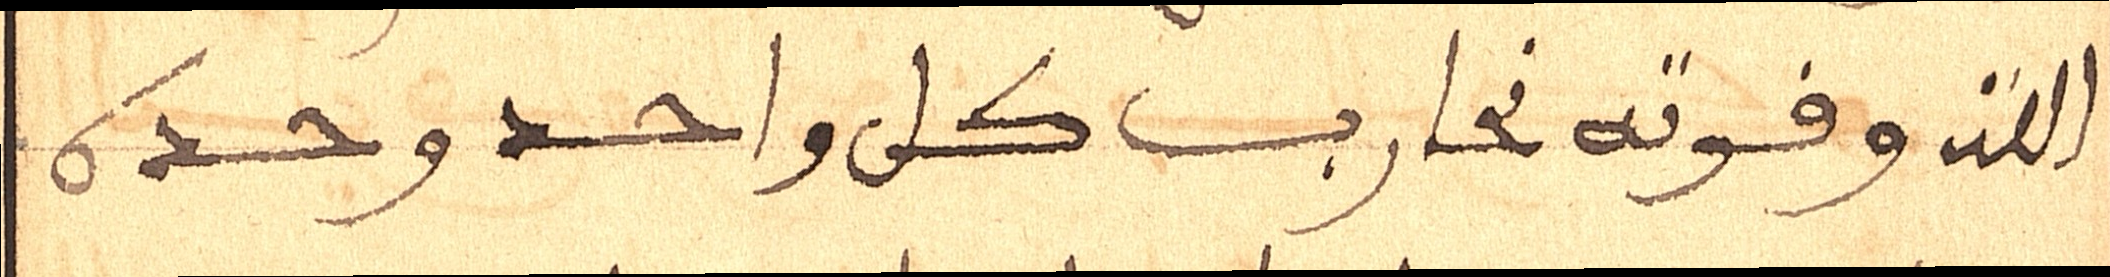الله وقوته نحارب كان احد وحده
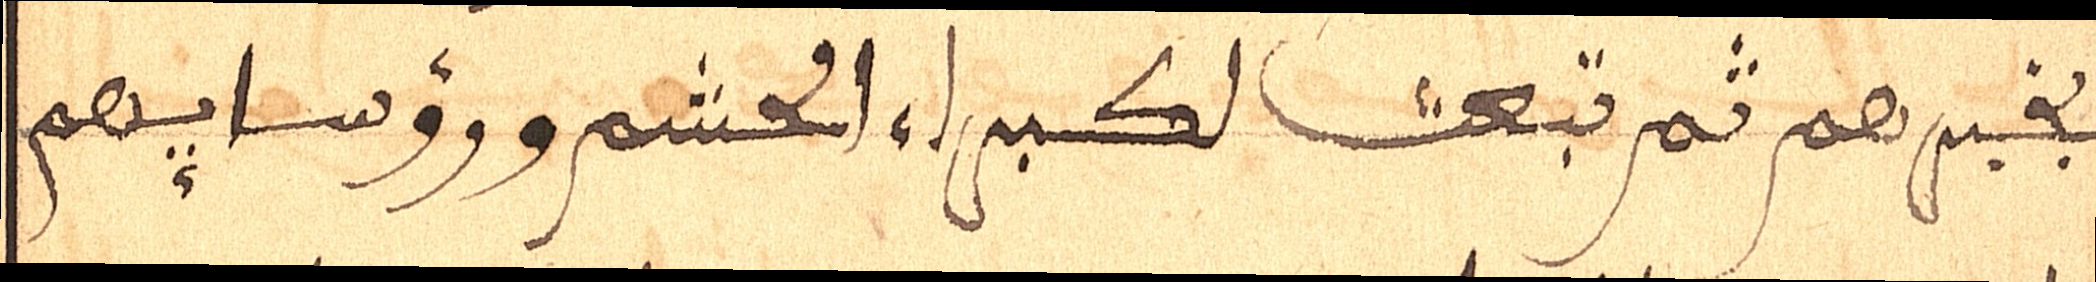بخبرهم ثم تبعث لكبراء الحشم ورؤسائهم
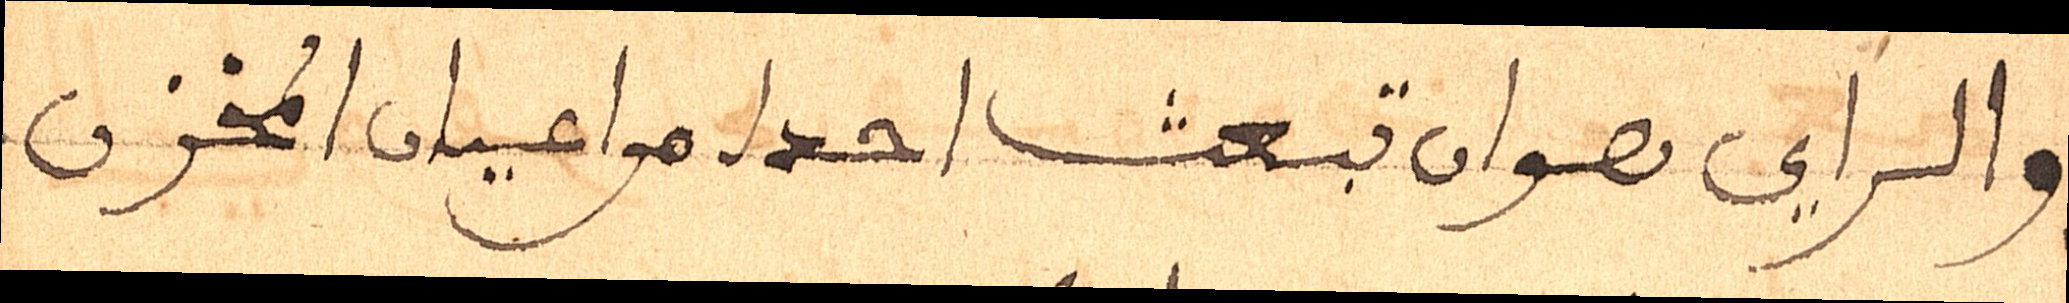والراي هو ان تبعث احد من اعيان المخزن
